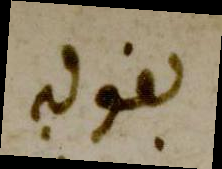بقوله
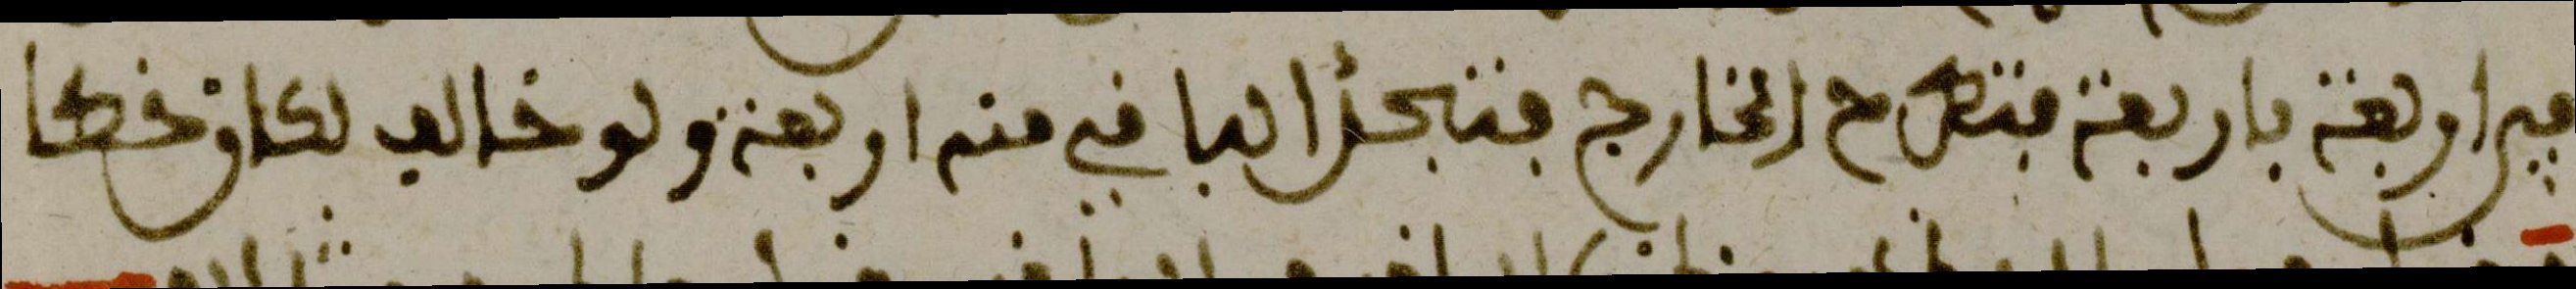في اربعة باربعة فتطرح الخارج فتجد الباقي منه اربعة و لو خالف لكان خطا
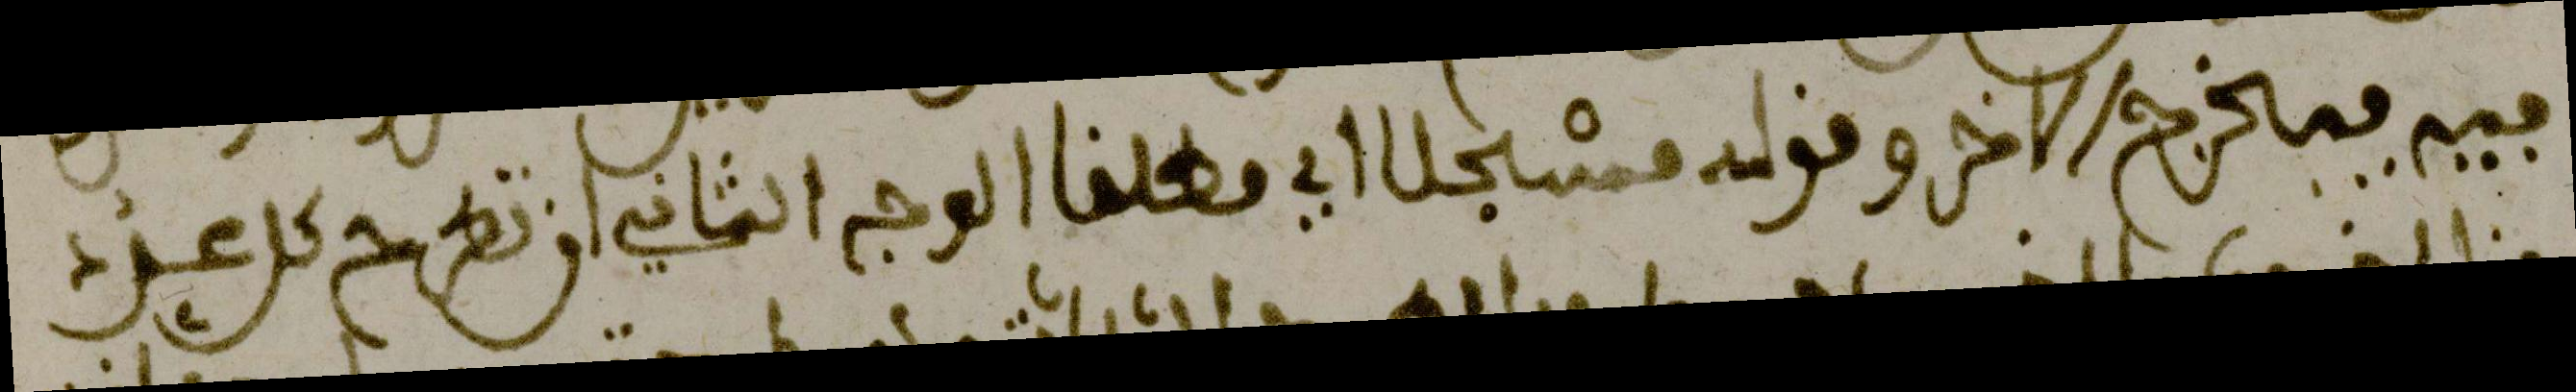فيه فيخرج الاخر و قوله مسجلا اي مطلقا الوجه الثاني ان تطرح كل عدد
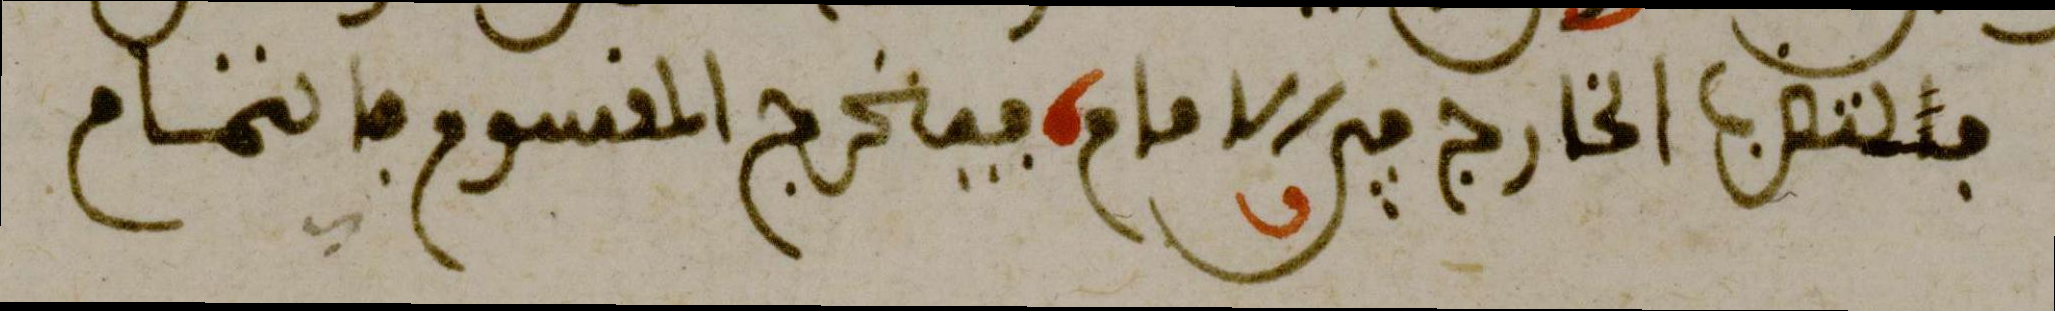فلتضرب الخارج في الامام فيخرج المقسوم بالتمام
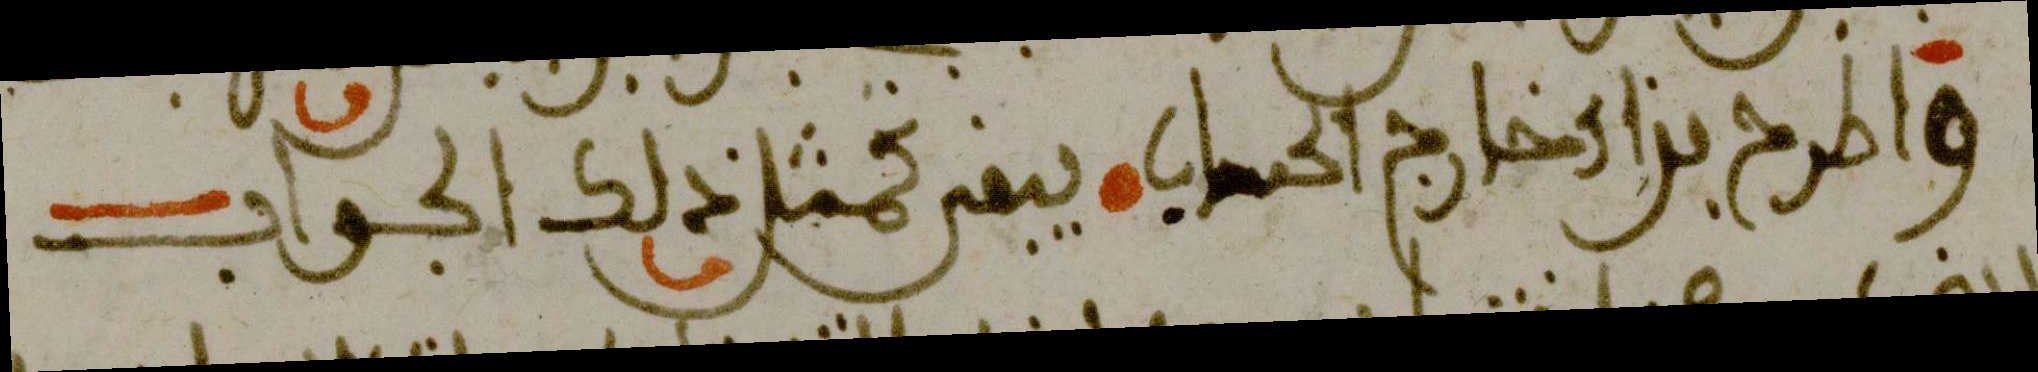و اطرح بذاك خارج الحساب يبقى كمثل ذلك الجواب
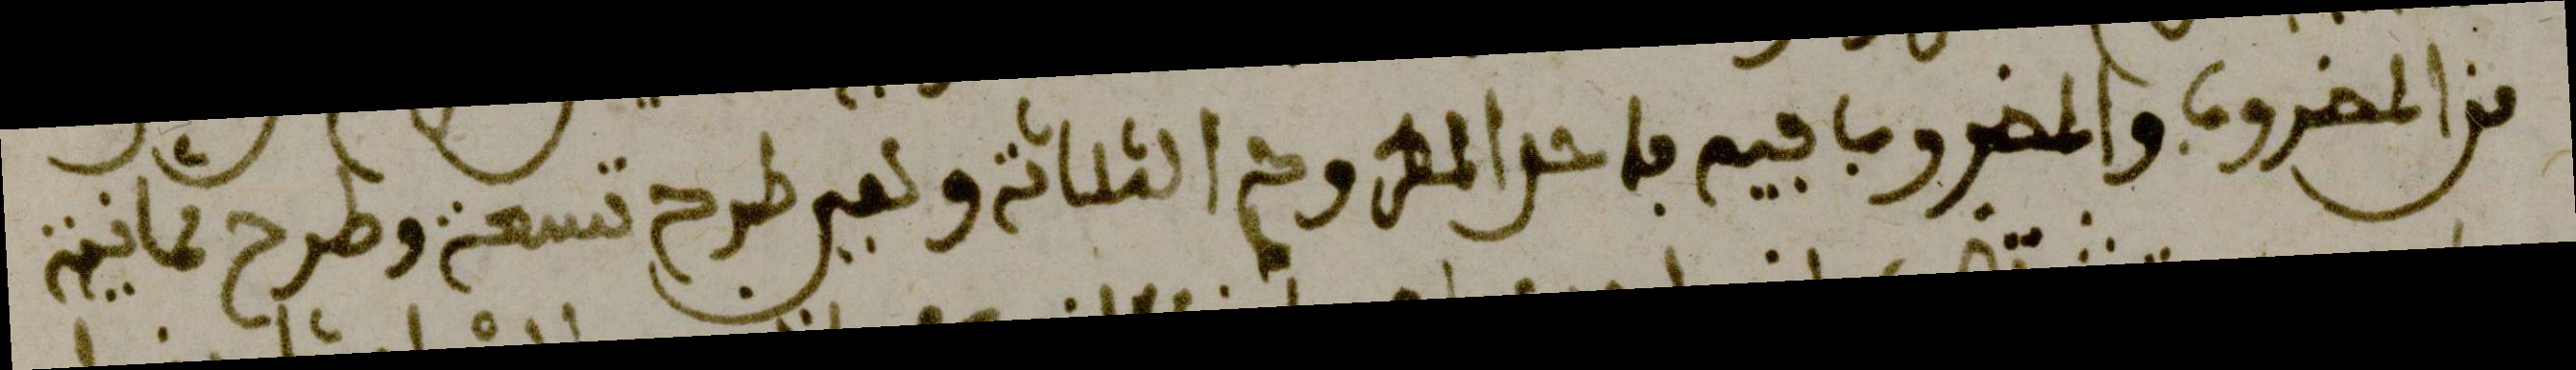من المضروب و المضروب فيه باحد الطروح الثلاثة و هي طرح تسعة و طرح ثمانية
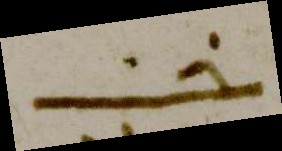خ
